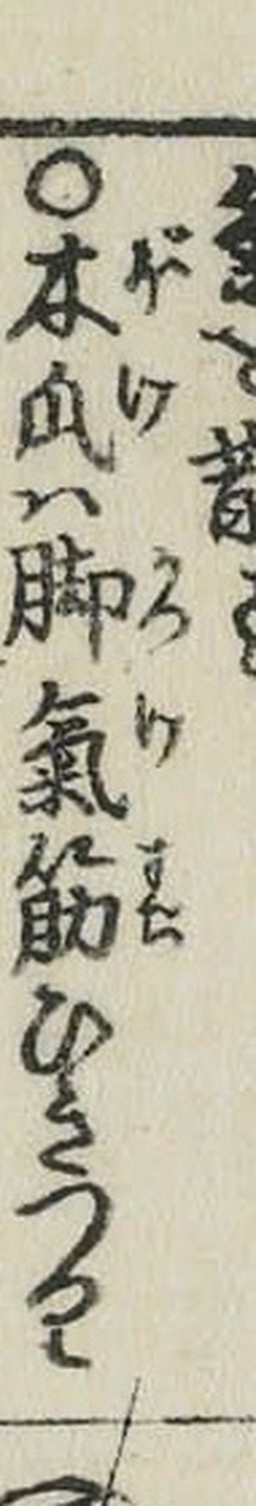○木瓜は脚気筋ひきつり
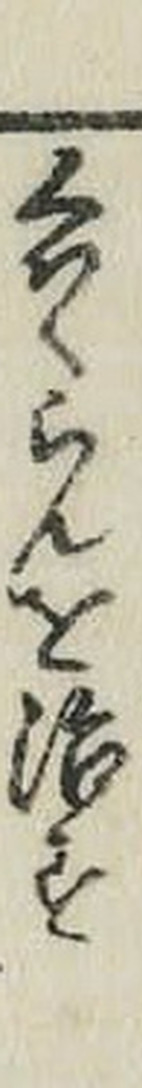くわくらんを治す
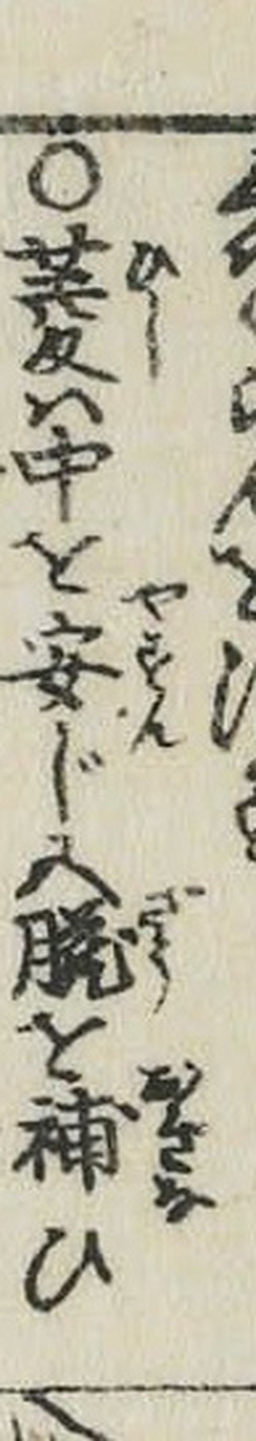○菱は中を安じ五臓を補ひ
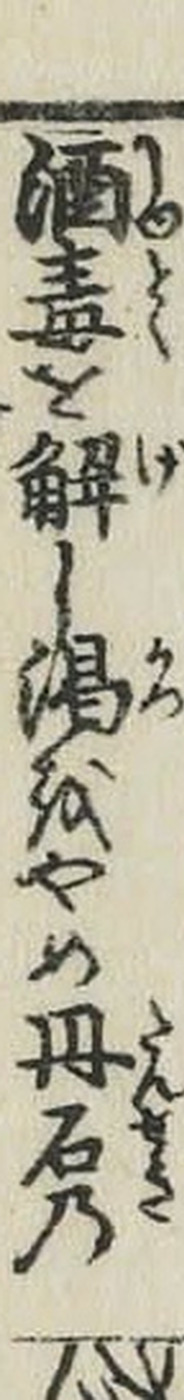酒毒を解し渇をやめ丹石の
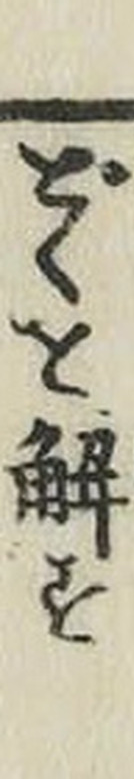どくを解す
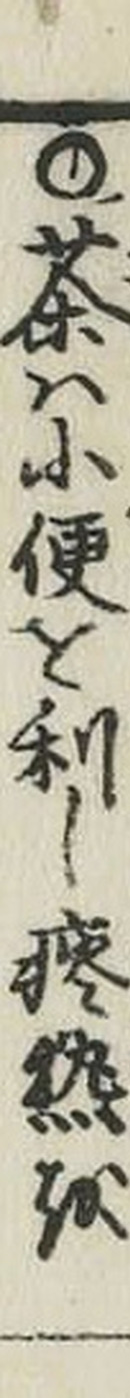○茶は小便を利し痰熱を
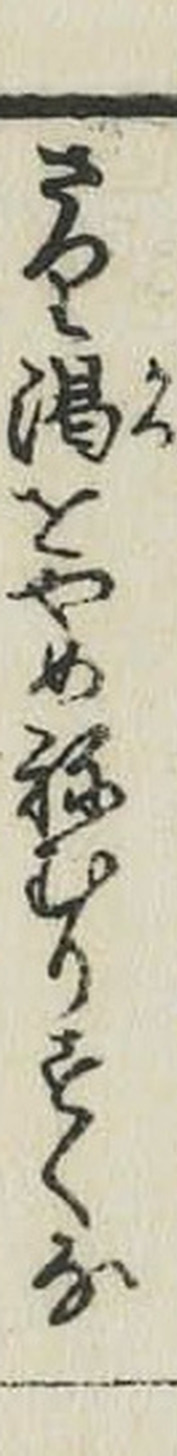さり渇をやめねむりすくな
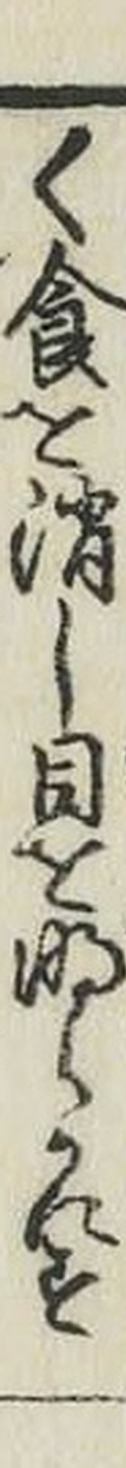く食を消し目を明らかにす
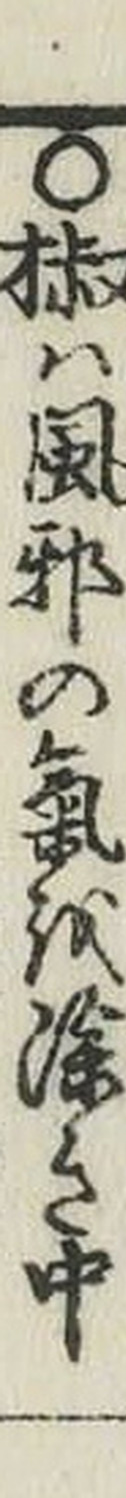○椒は風邪の気を除き中
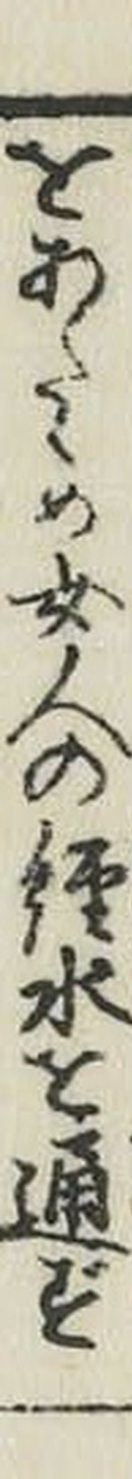をあたゝめ女人の経水を通ず
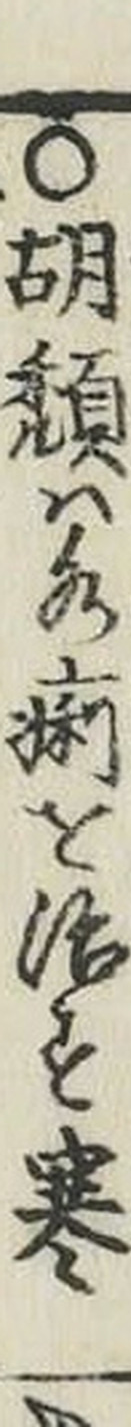○胡頽は水痢を治す寒
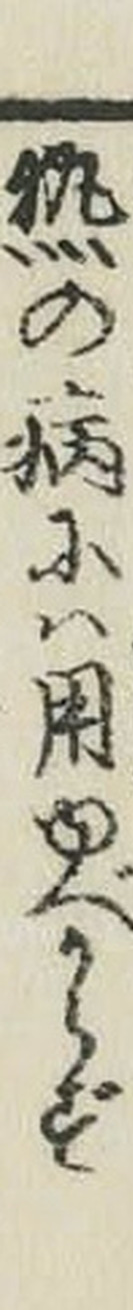熱の病には用ゆべからず
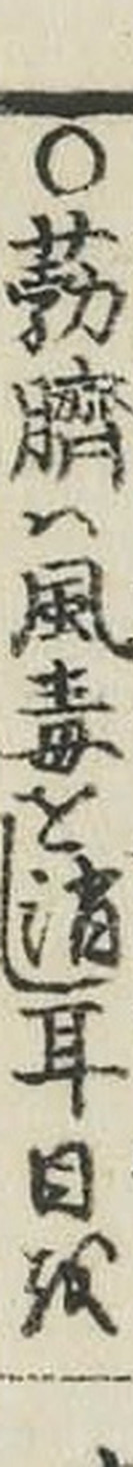○葧臍は風毒を消し耳目を
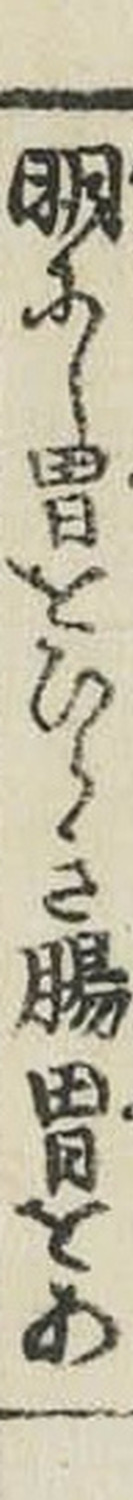明にし胃をひらき腸胃をあ
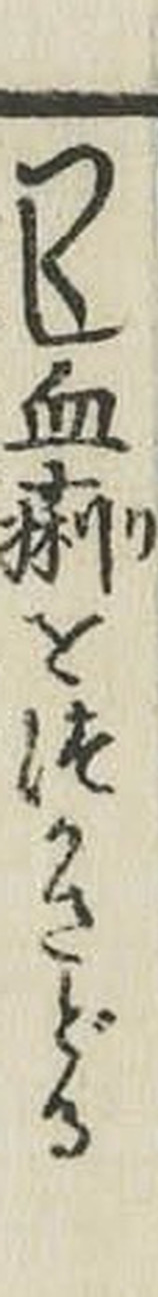つくし血痢をつかさどる
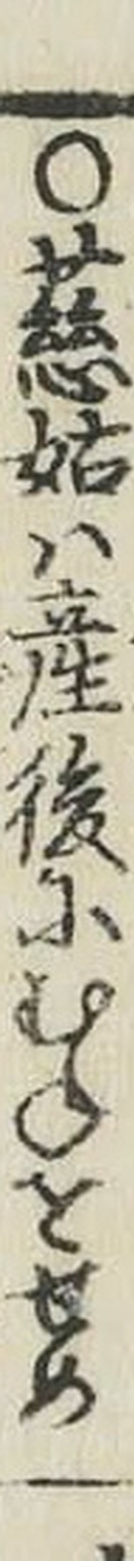○慈姑は産後にむねをせめ
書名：増補頭書訓蒙図彙大成 10巻 8:巻之17-19
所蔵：東京学芸大学教育コンテンツアーカイブ
